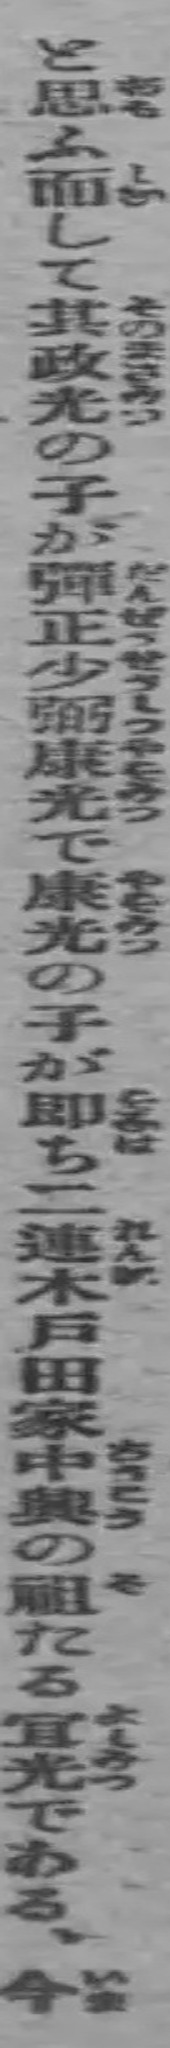と思ふ而して其政光の子が弾正少弼康光で康光の子が即ち二連木戸田家中興の祖たる宜光である、今
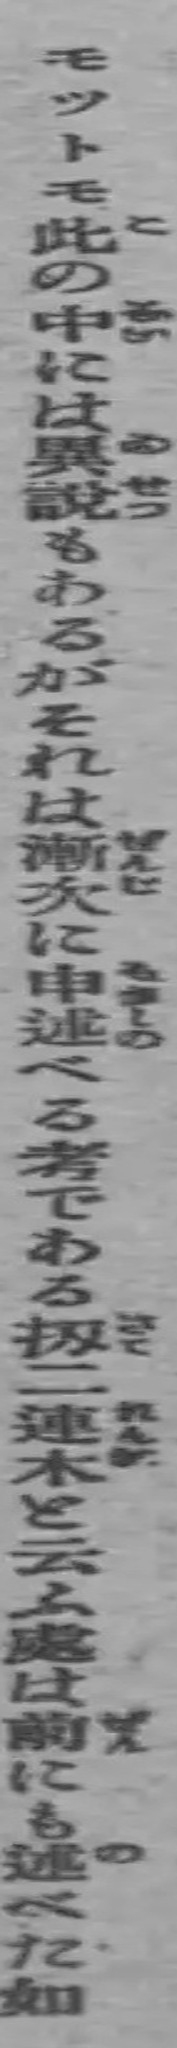モツトモ此の中には異説もあるがそれは漸次に申述べる考である扨二連木と云ふ処は前にも述べた如
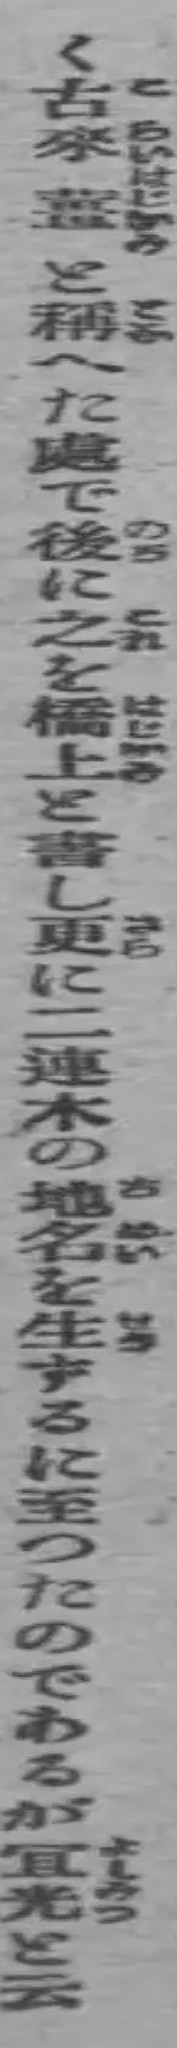く古来薑と称へた処で後に之を橋上と書し更に二連木の地名を生ずるに至つたのであるが宜光と云
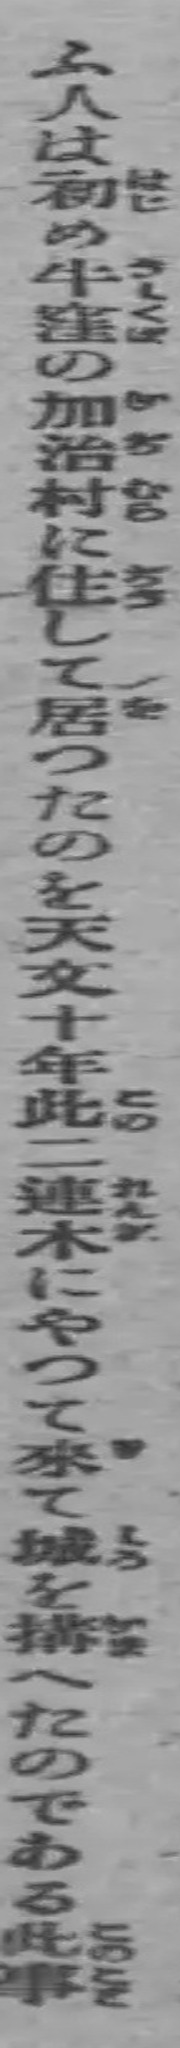ふ人は初め牛窪の加治村に住して居つたのを天文十年此二連木にやつて来て城を搆へたのである此事
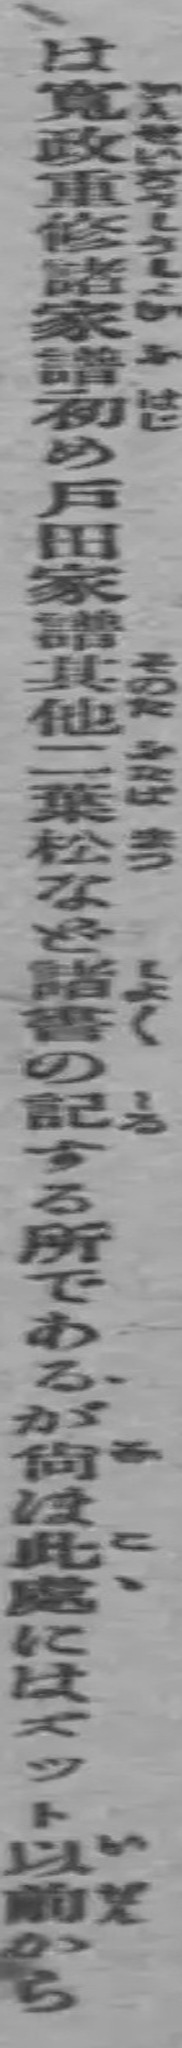は寛政重修諸家譜初め戸田家譜其他二葉松など諸書の記する所であるが尚ほ此処にはズツト以前から
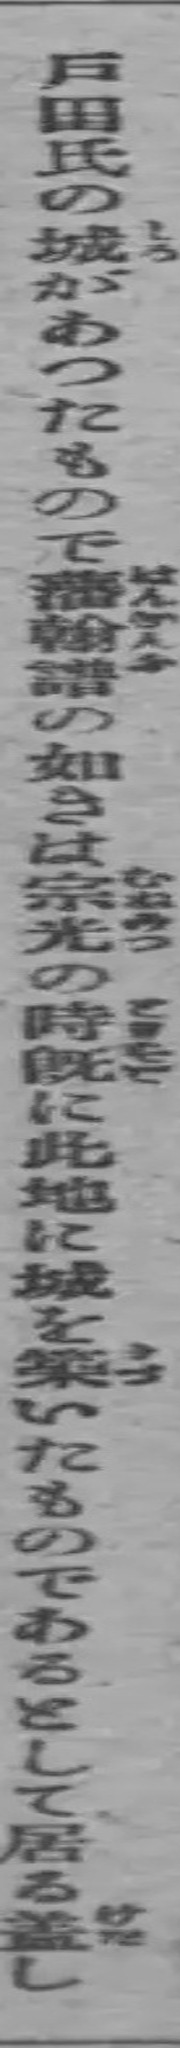戸田氏の城があつたもので藩翰譜の如きは宗光の時既に此地に城を築いたものであるとして居る蓋し
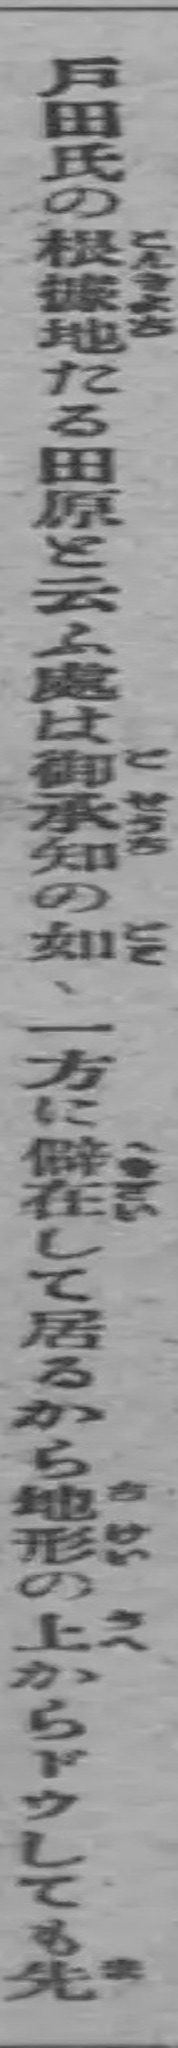戸田氏の根拠地たる田原と云ふ処は御承知の如く一方に僻在して居るから地形の上からドウしても先
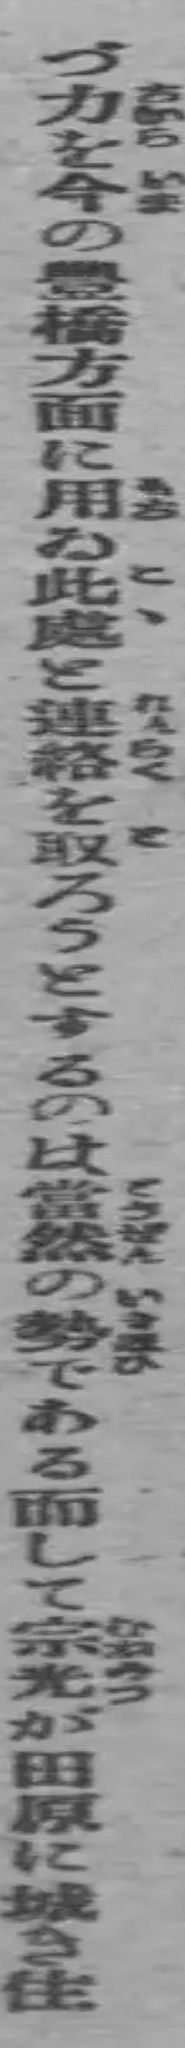づ力を今の豊橋方面に用ゐ此処と連絡を取ろうとするのは当然の勢である而して宗光が田原に城き住
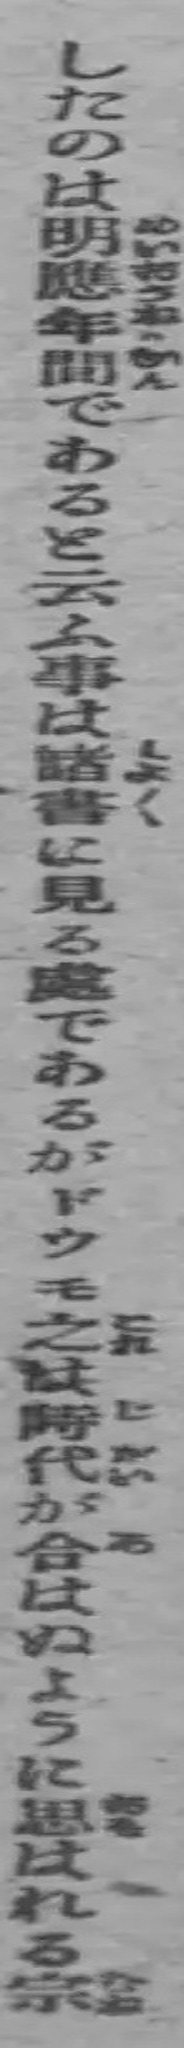したのは明応年間であると云ふ事は諸書に見る処であるがドウモ之は時代が合はぬように思はれる宗
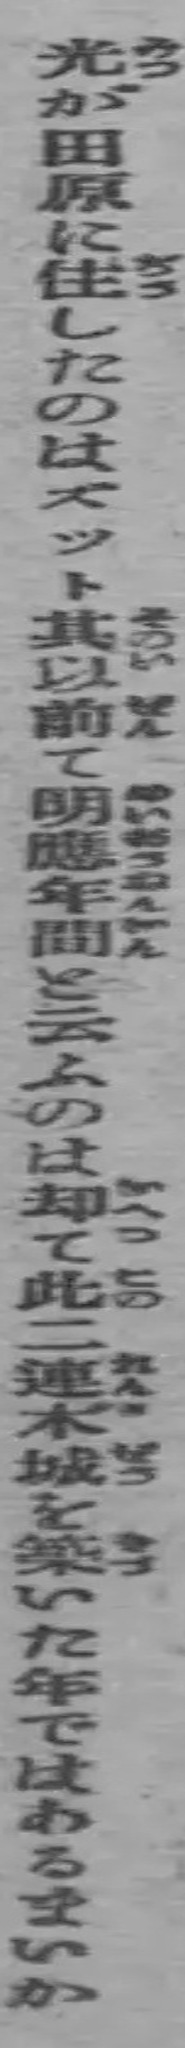光が田原に住したのはズツト其以前て明応年間と云ふのは却て此二連木城を築いた年ではあるまいか
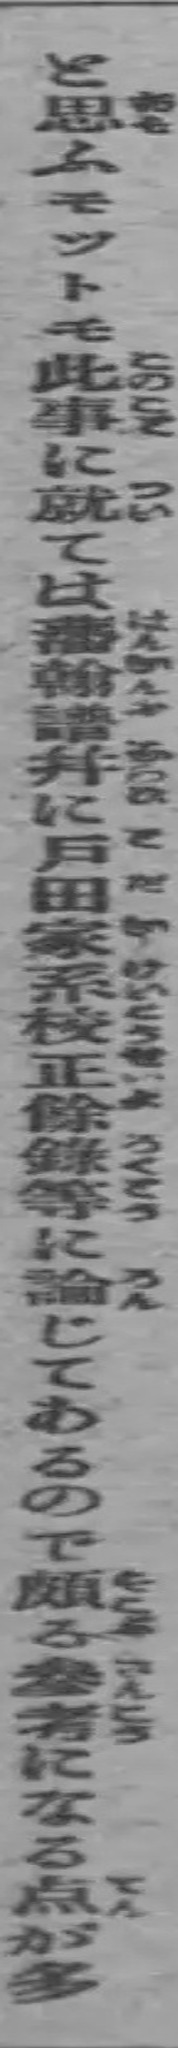と思ふモツトモ此事に就ては藩翰譜幷に戸田家系校正余録等に論じてあるので頗る参考になる点が多

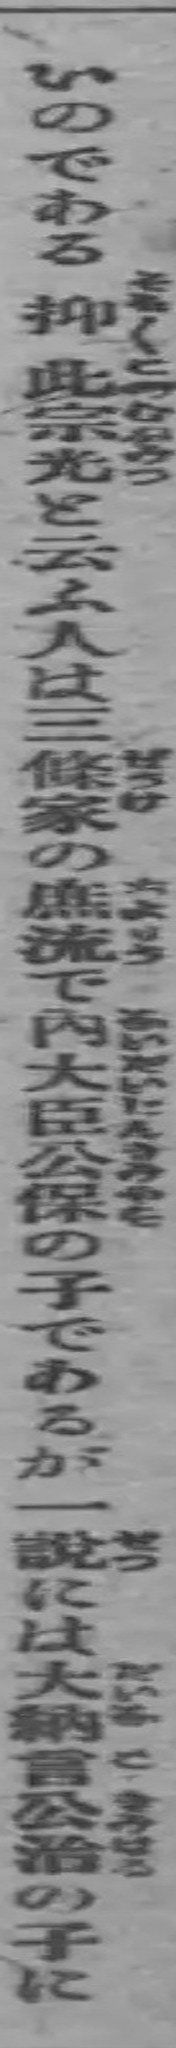いのである抑此宗光と云ふ人は三条家の庶流で内大臣公保の子であるが一説には大納言公治の子に
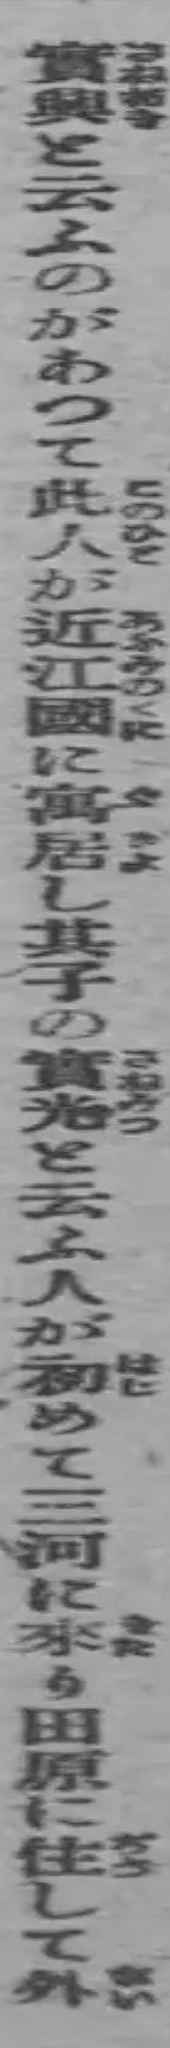実興と云ふのがあつて此人が近江国に寓居し其子の実光と云ふ人が初めて三河に来り田原に住して外
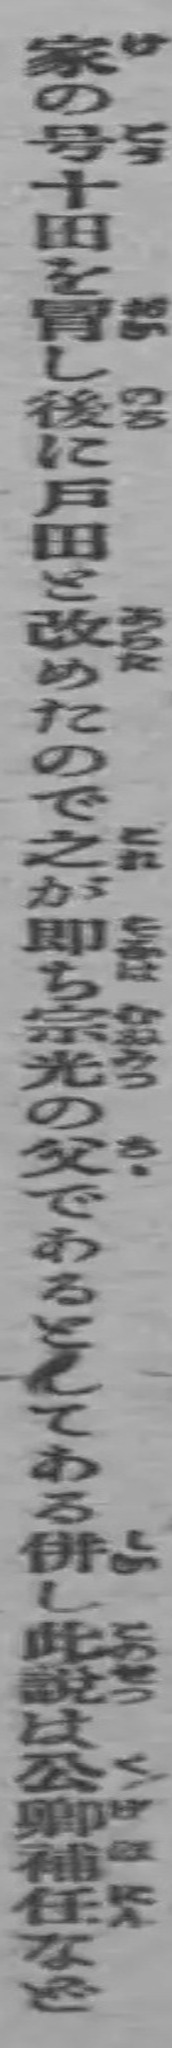家の号十田を冒し後に戸田と改めたので之が即ち宗光の父であるとしてある併し此説は公卿補任など
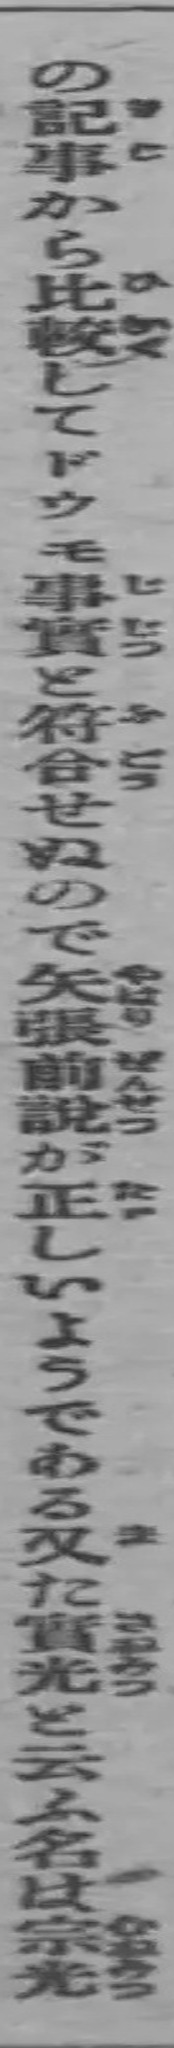の記事から比較してドウモ事実と符号せぬので矢張前説が正しいようである又た実光と云ふ名は宗光
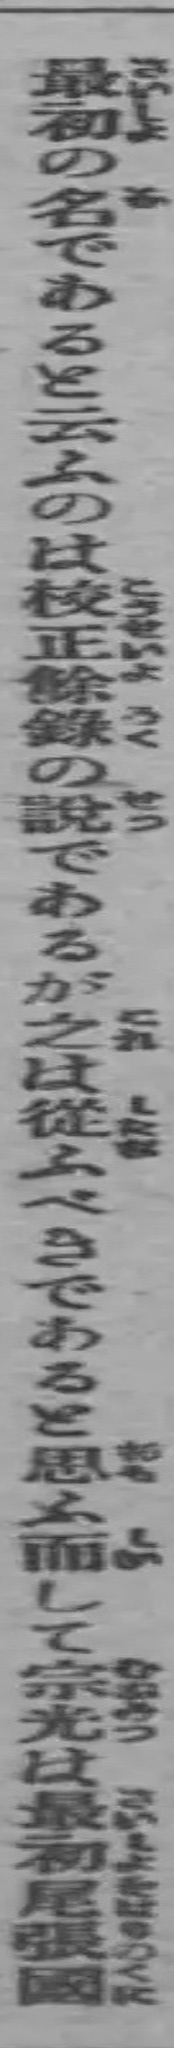最初の名であると云ふのは校正余録の説であるが之は従ふべきであると思ふ而して宗光は最初尾張国
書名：豊橋市史談
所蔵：国立国会図書館 National Diet Library, JAPAN
